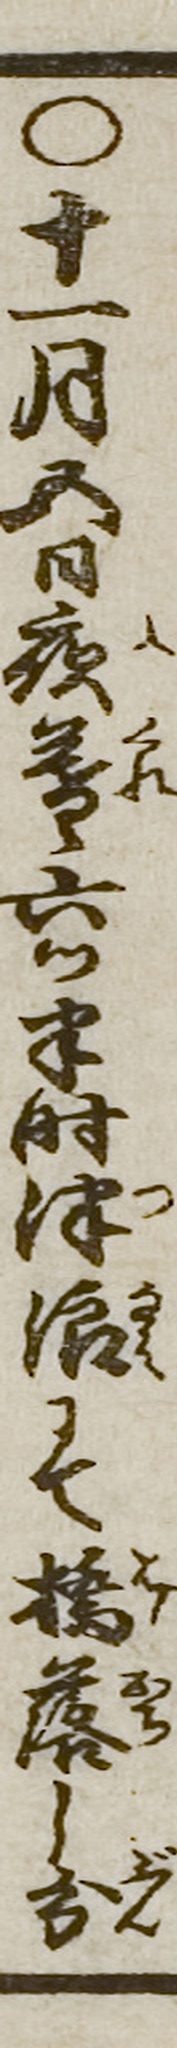〇十一月五日夜暮六つ半時津浪にて橋落し分
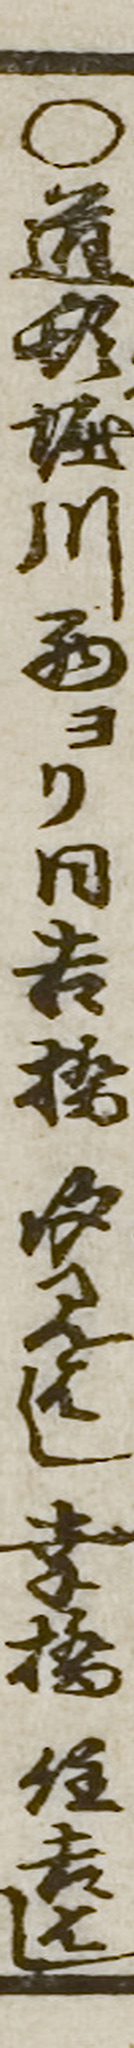〇道頓堀川西ヨリ日吉橋汐見はし幸橋住吉はし
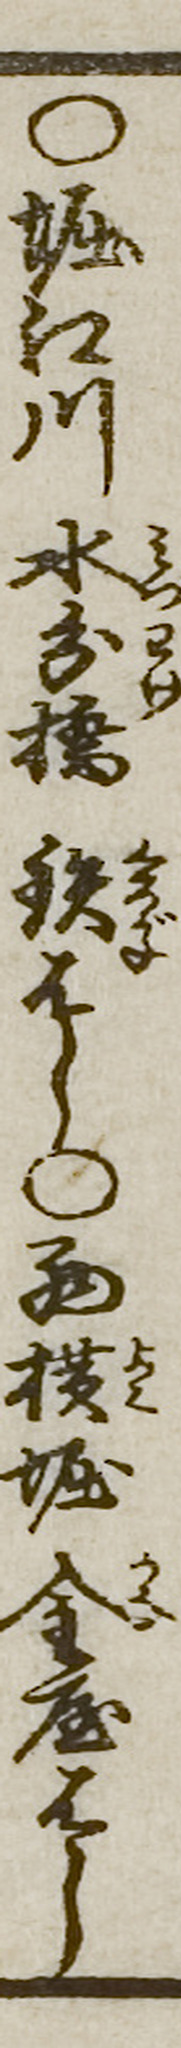〇堀江川水分橋鉄はし〇西横堀金屋はし
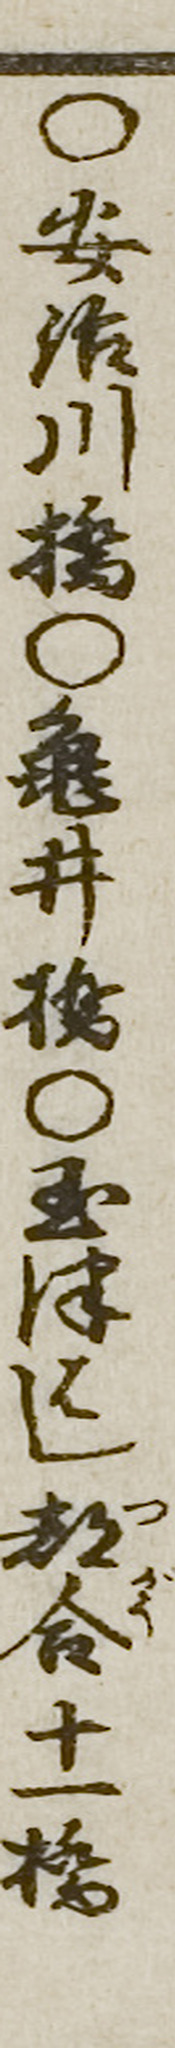〇安治川橋〇亀井橋〇玉津はし都合十一橋
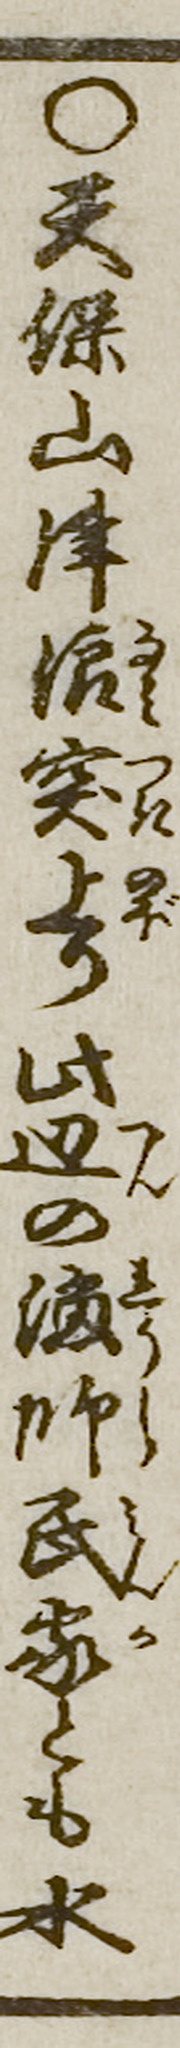〇天保山津浪突上り此辺の漁師民家とも水
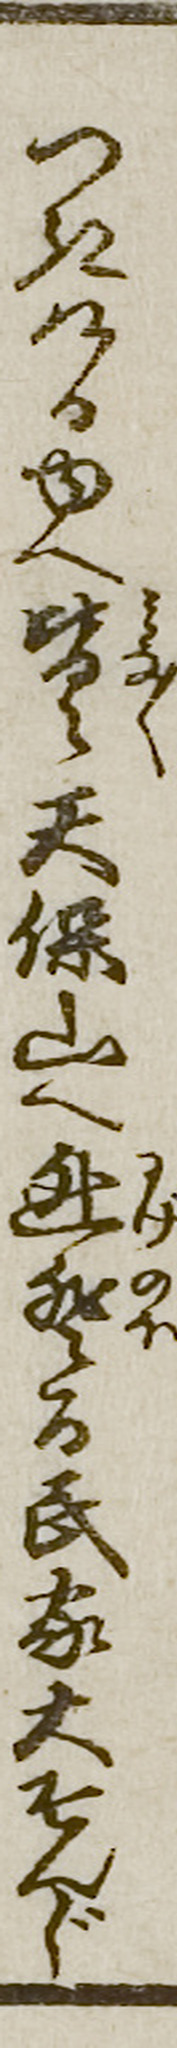つきけるゆへ皆々天保山へ逃登る民家大そんじ
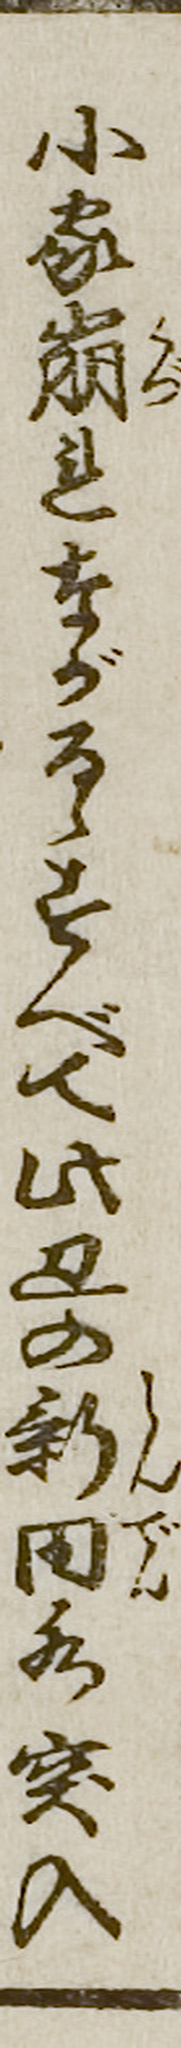小家崩れながるゝすべて此辺の新田水突入
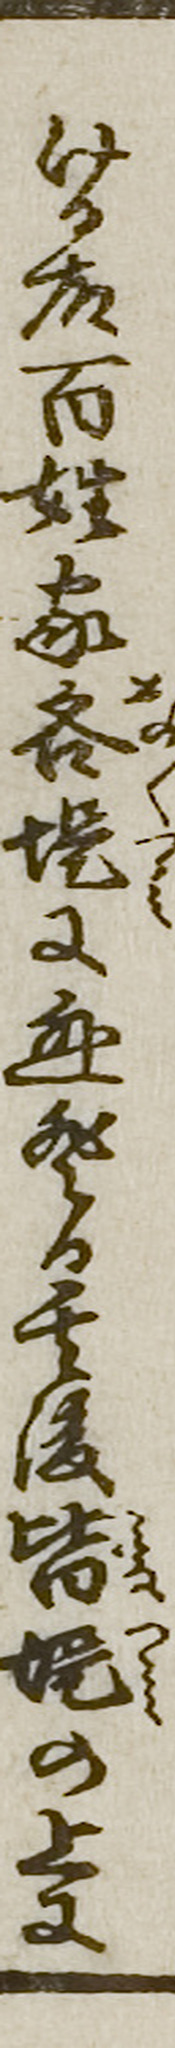ける故百姓家各堤に逃登る其後皆堤の上に
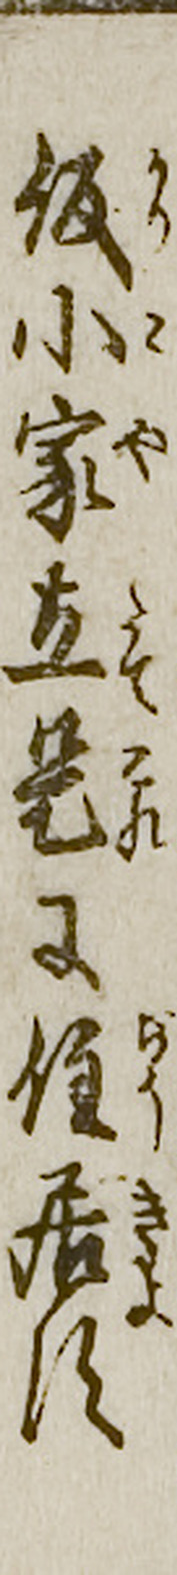仮小屋立是に住居す
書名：大坂川口新田之図
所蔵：東京大学総合図書館 General Library in the University of Tokyo, JAPAN
